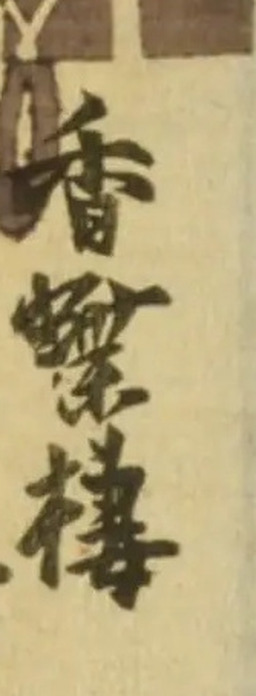香蝶棲
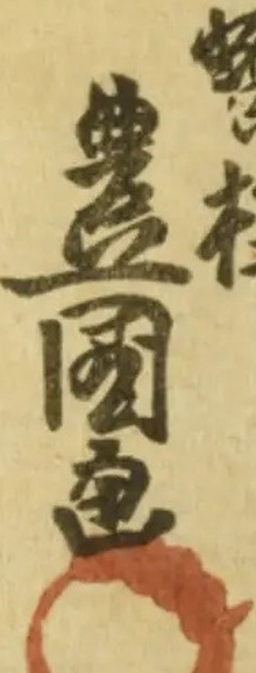豊国画
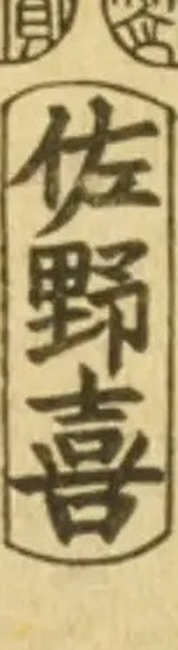佐野喜
